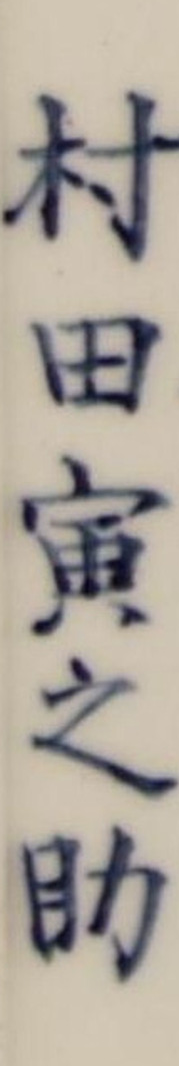村田寅之助

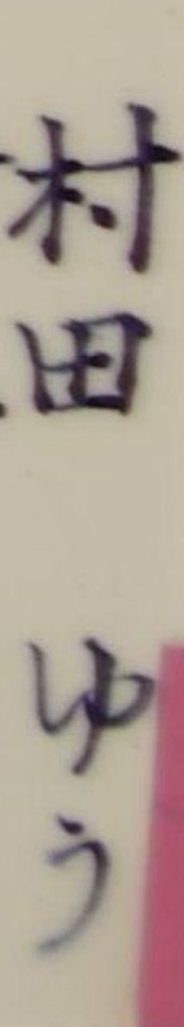村田ゆう
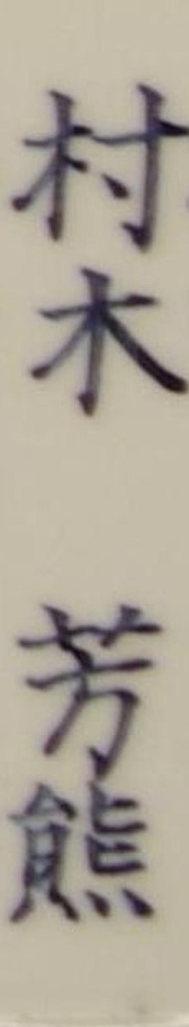村木芳熊
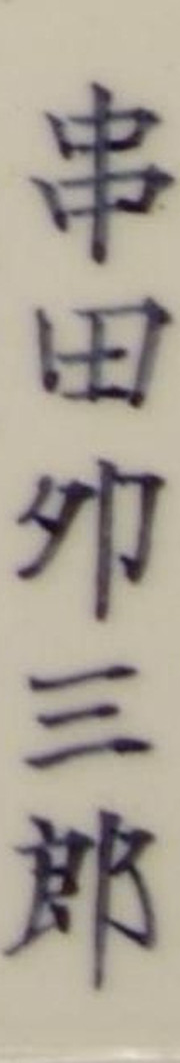串田卯三郎
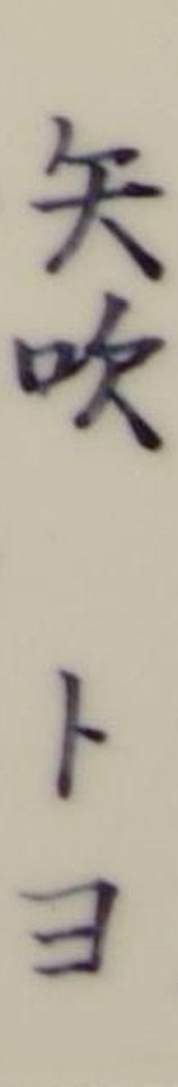矢吹トヨ
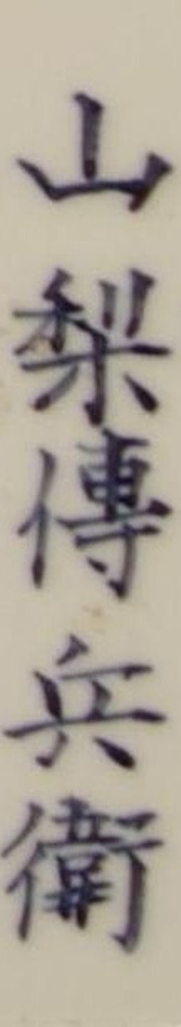山梨傳兵衛
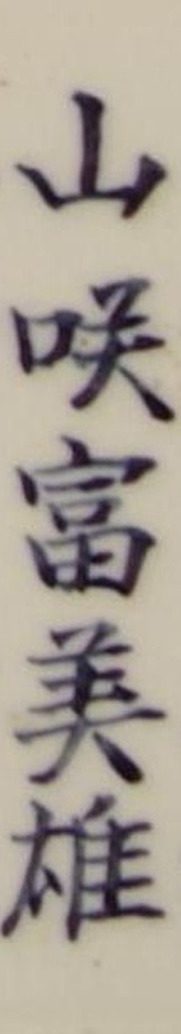山咲富美雄
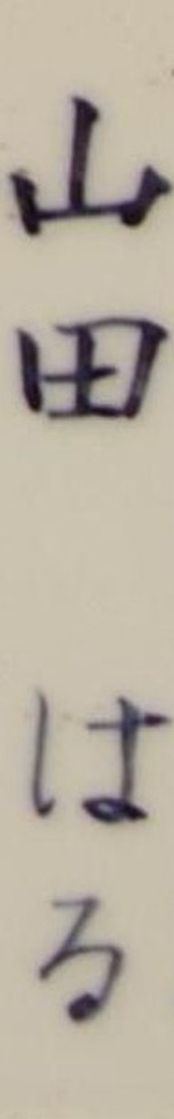山田はる
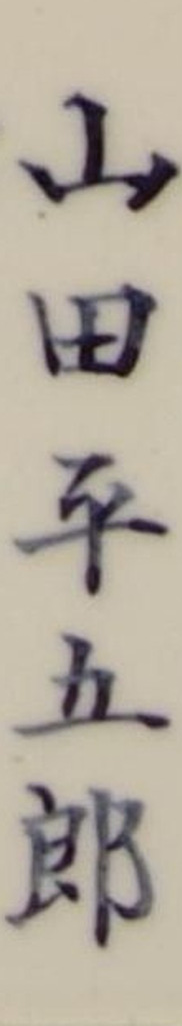山田平五郎
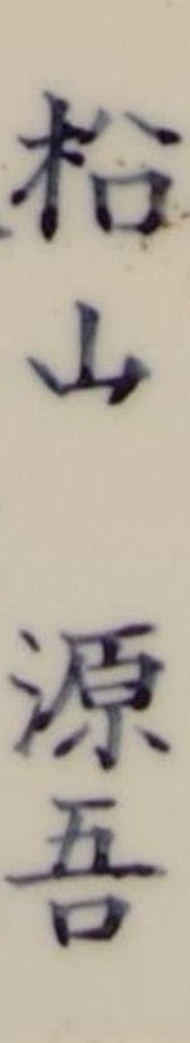松山源吾
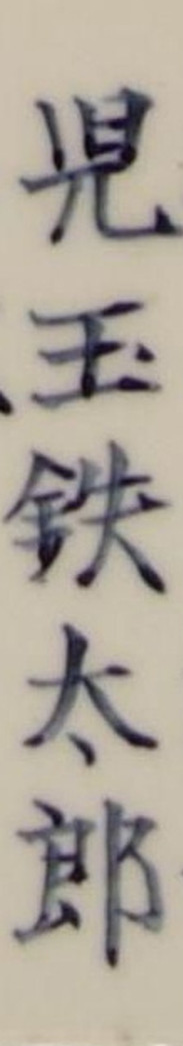児玉鉄太郎
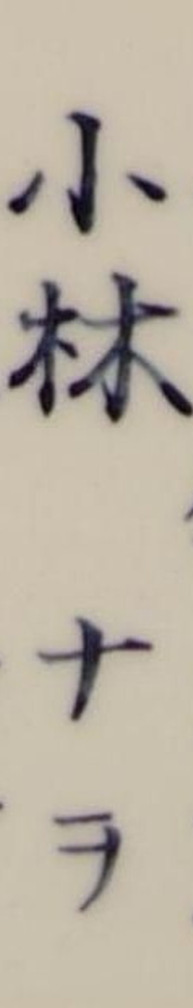小林ナヲ
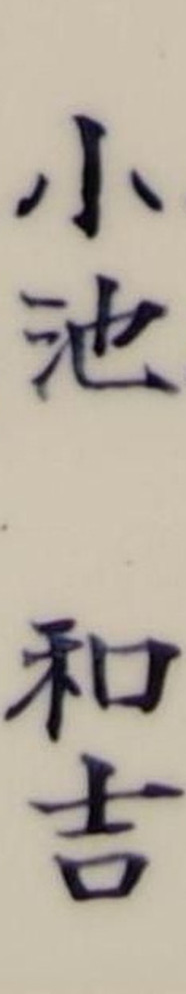小池和吉
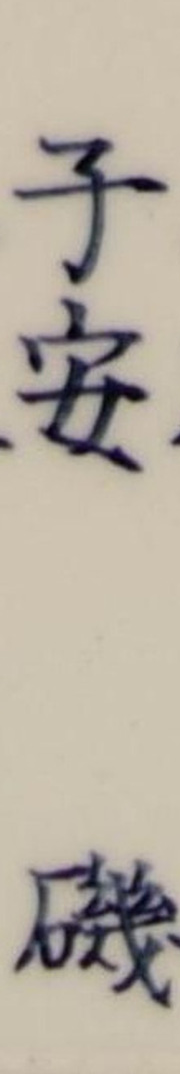子安磯
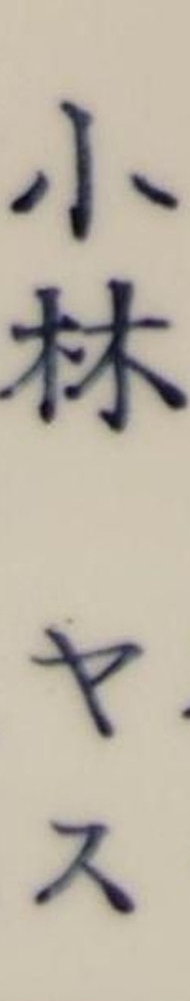小林ヤス
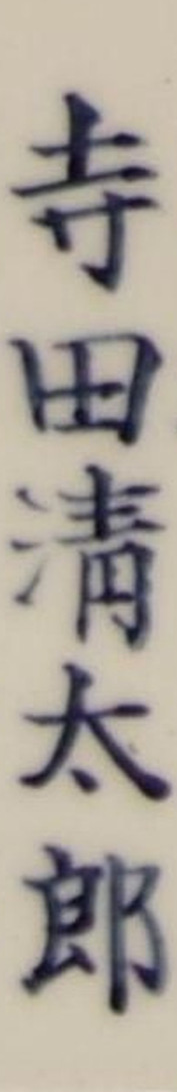寺田清太郎
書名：M~S
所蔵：高野山金剛峯寺
